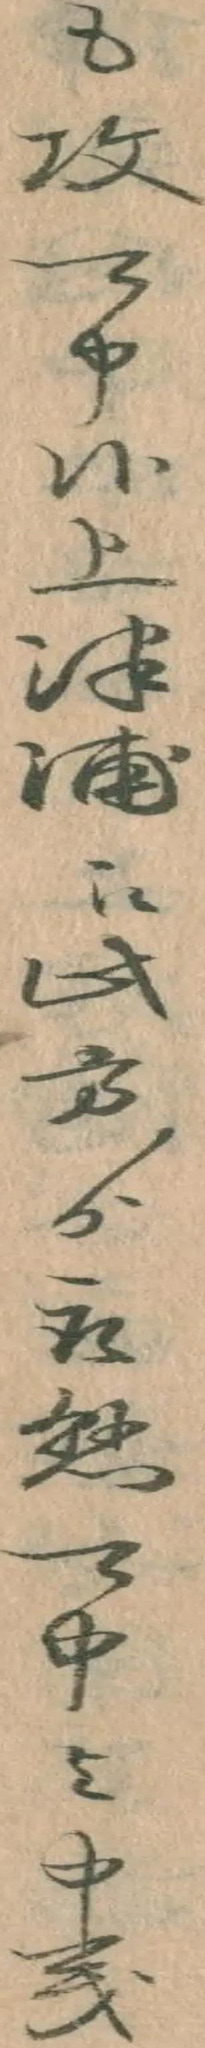も攻可申候上津浦江此方ゟ取懸可申与申義
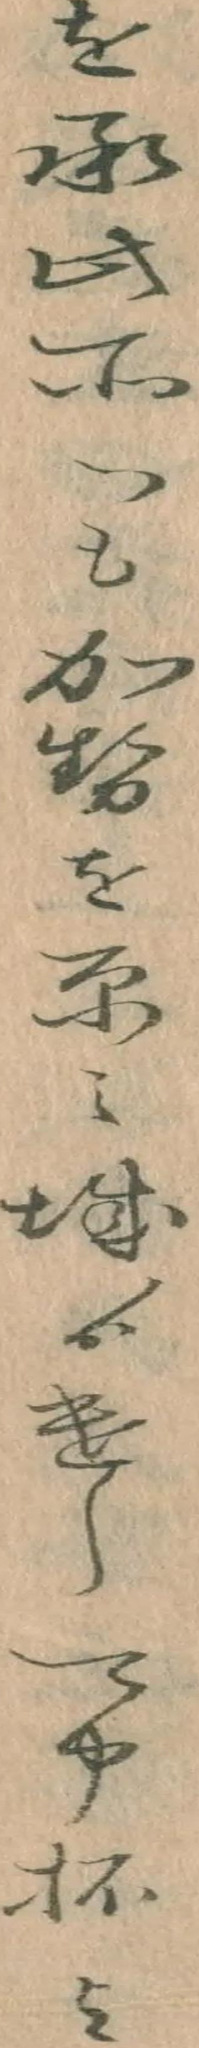を承此所へも加勢を原之城ゟ遣し可申抔与
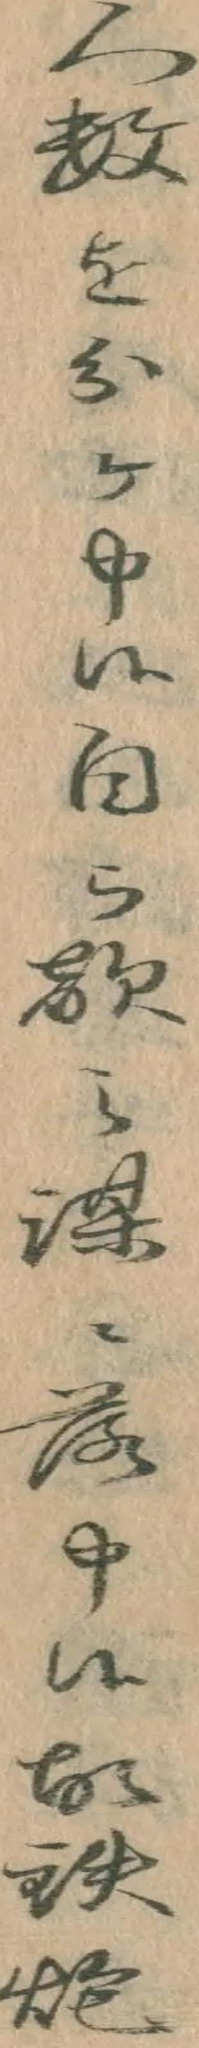人数を分け申候自ら敵之謀に茂申候故鉄炮
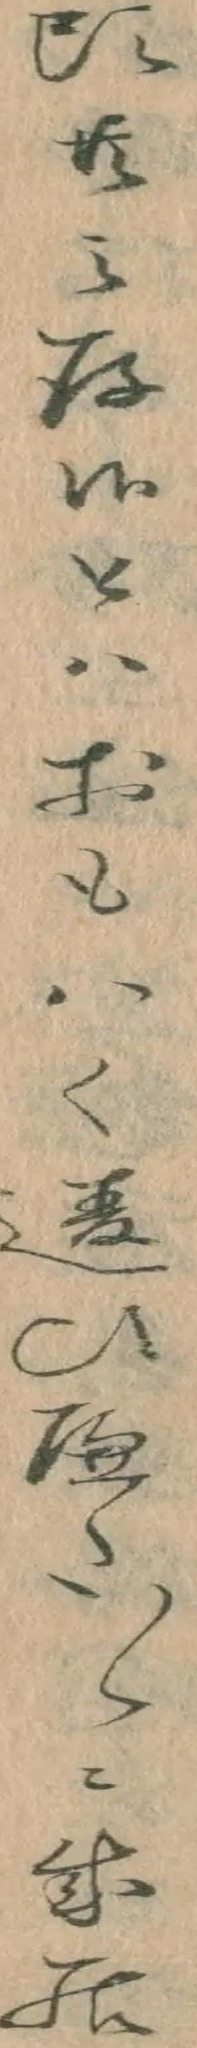頭共之存候とはおもはく違ひ扁た〱に成居
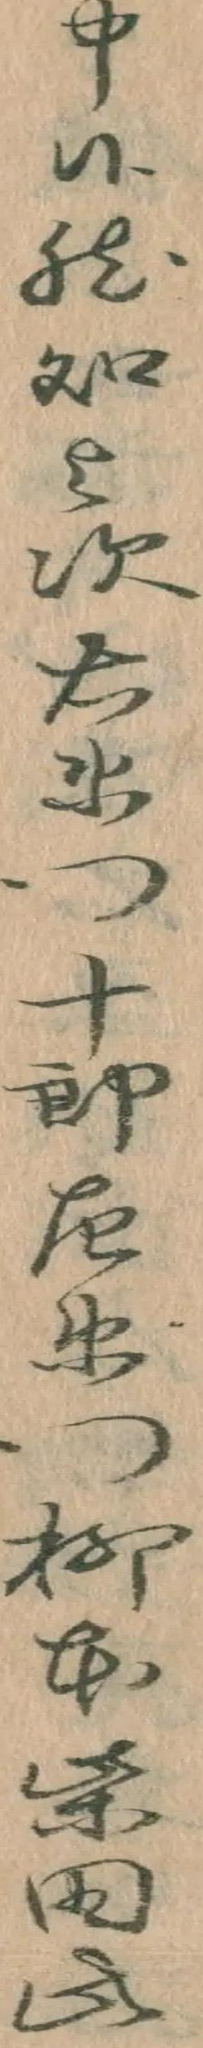申候然処与次右衛門十郎左衛門柳本柴田氏
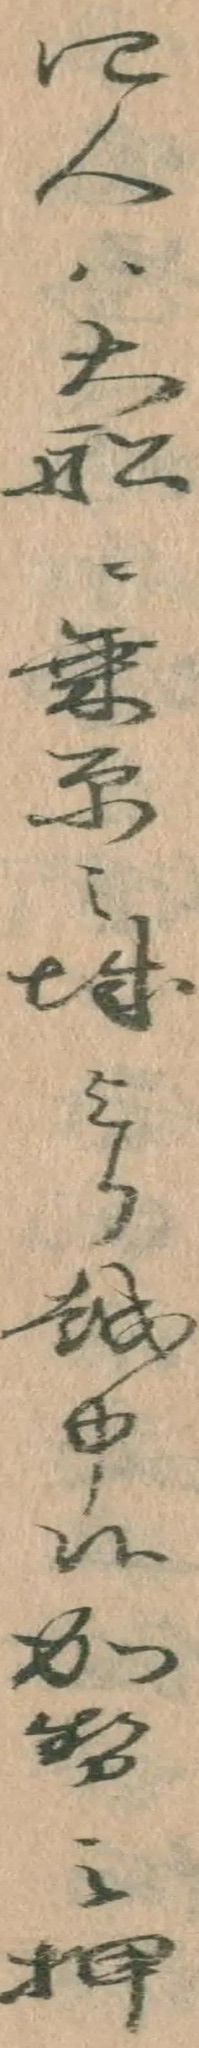四人は大舩に乗原之城与り越申候加勢之押
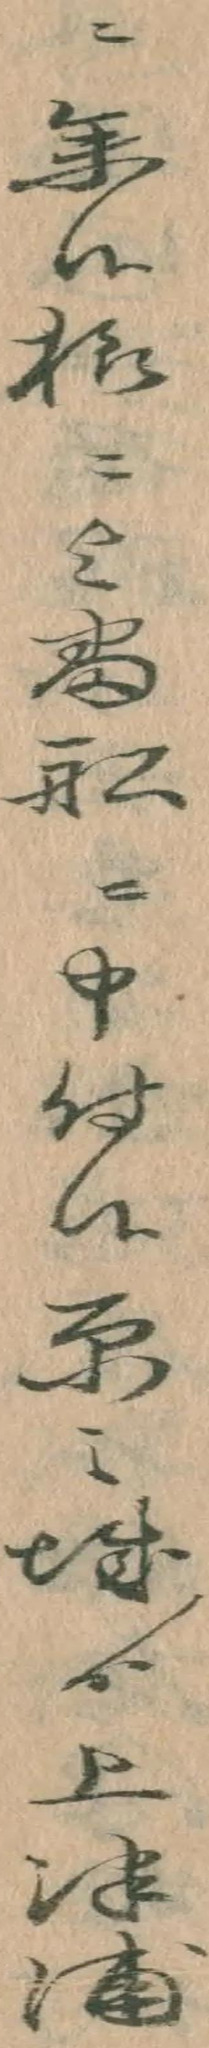に参候様に与番舩に申付候原之城ゟ上津浦
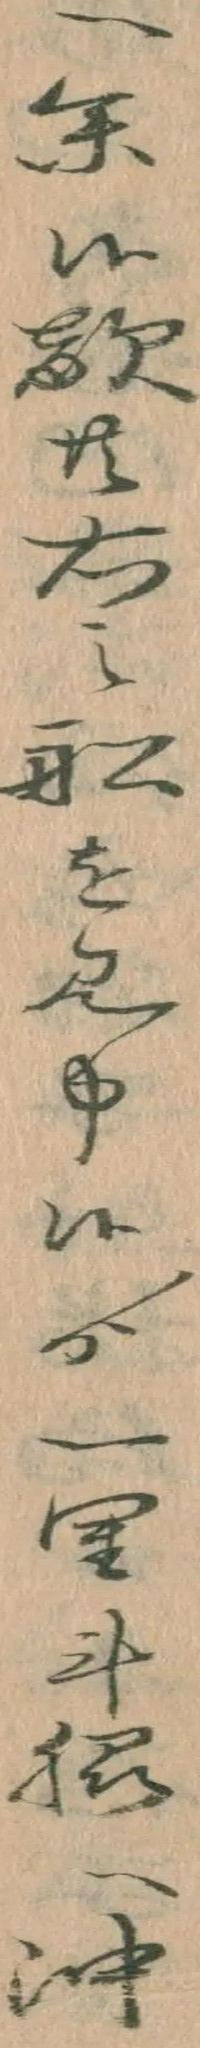へ参候敵共右之舩を見申候ゟ一里斗脇へ沖
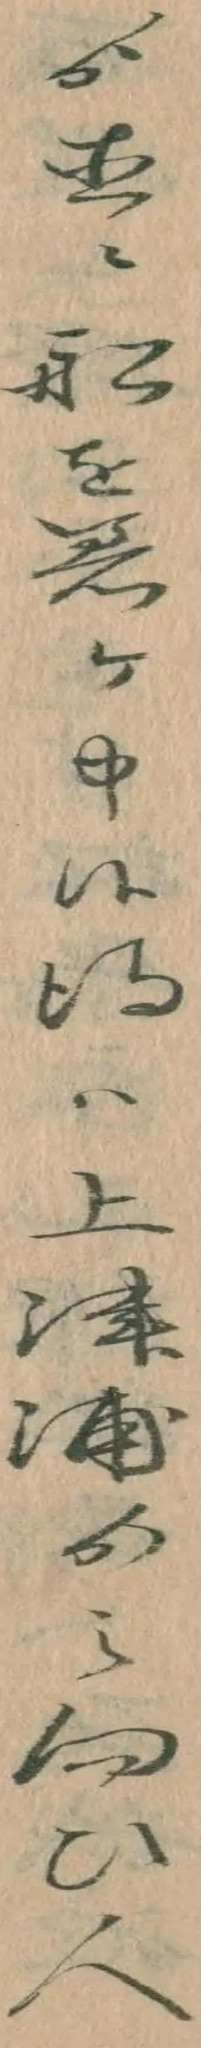ゟ直に舩を着け申候得は上津浦ゟ之向ひ人
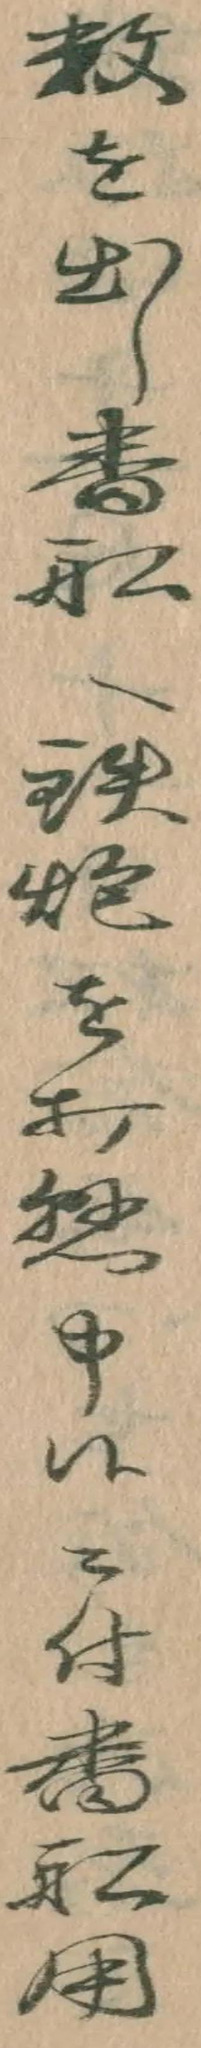数を出し番舩へ鉄炮を打懸申候に付番舩用
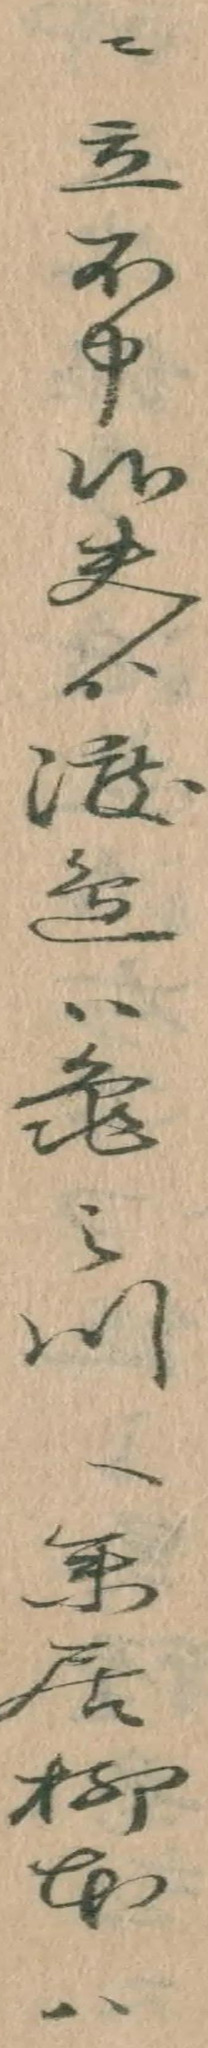に立不申候夫ゟ渡辺は亀之川へ参居柳本は
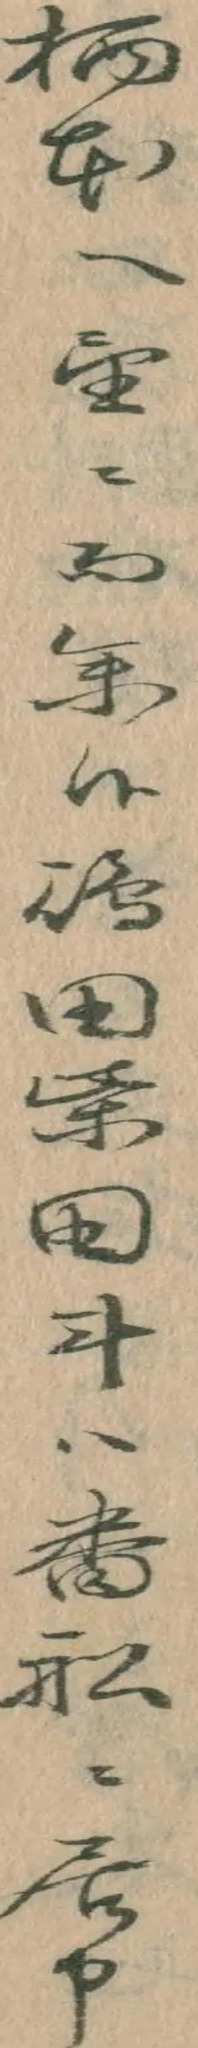栖本へ届に而参候島田柴田斗は番舩に居申
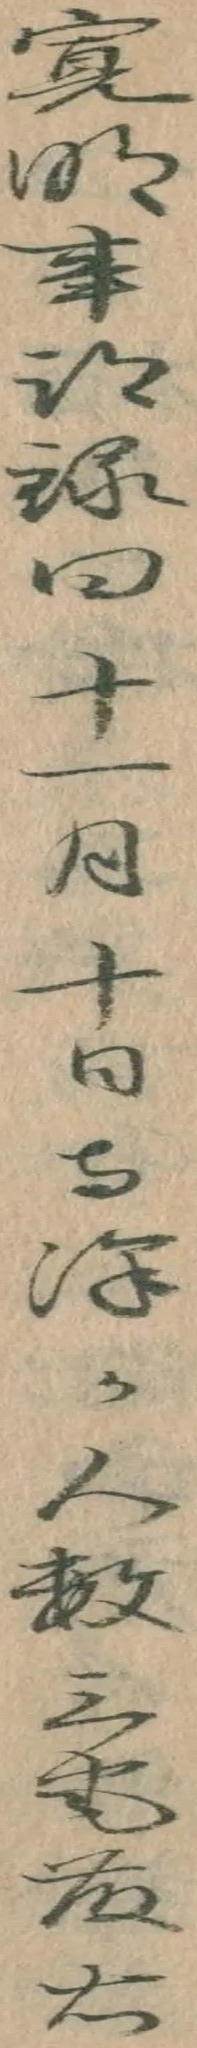寛明事跡録曰十一月十日寺沢か人数三宅藤右
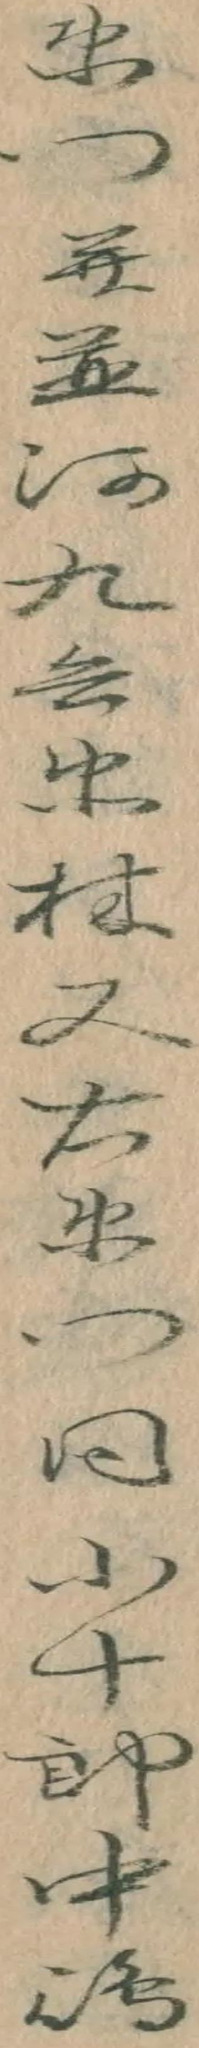衛門幷並河久兵衛林又右衛門曰小十郎中島
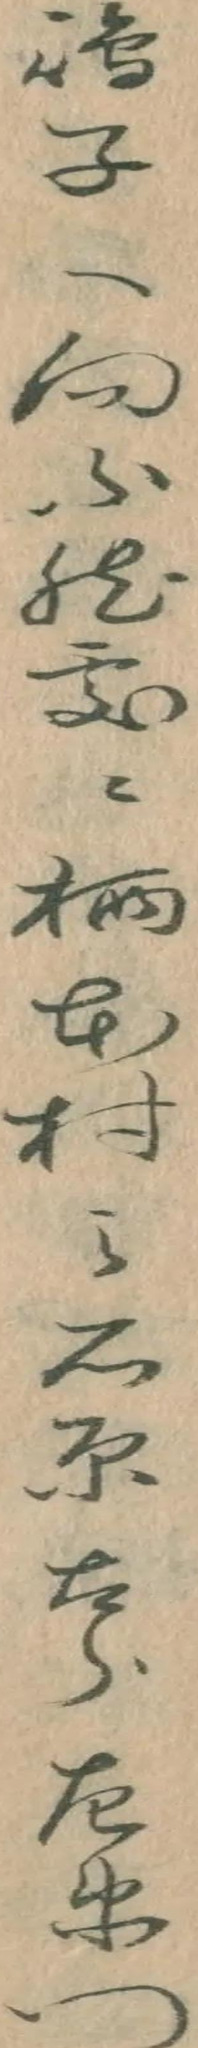島子へ向ふ然處に栖本村之石原太郎左衛門

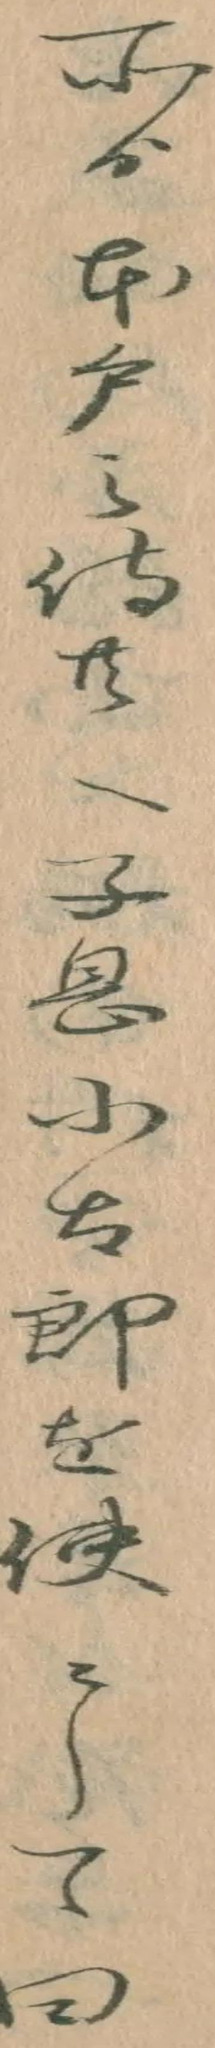所ゟ本戸之侍共へ子息小太郎を使にして曰
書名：切支丹御退治記 49巻. [2]
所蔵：国立国会図書館 National Diet Library, JAPAN
